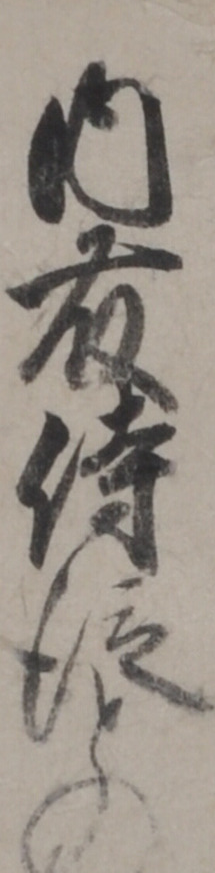内藤侍従とのへ

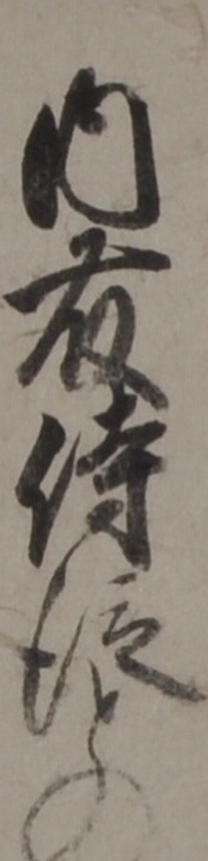内藤侍従とのへ

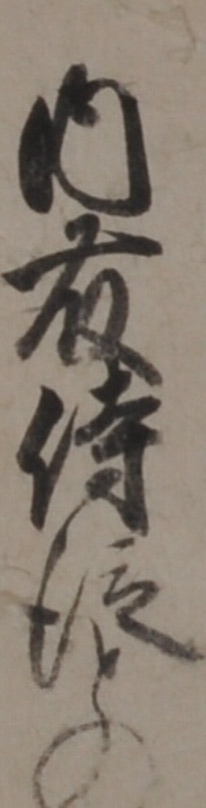内藤侍従とのへ
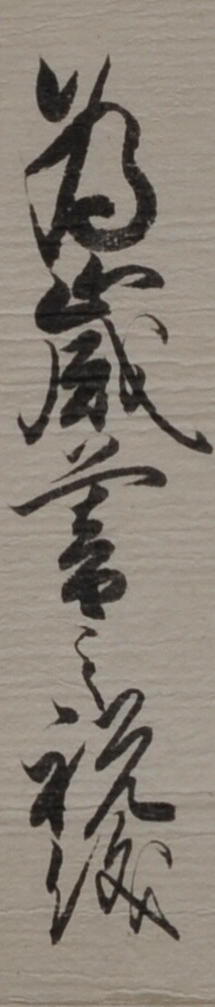為歳暮之祝儀
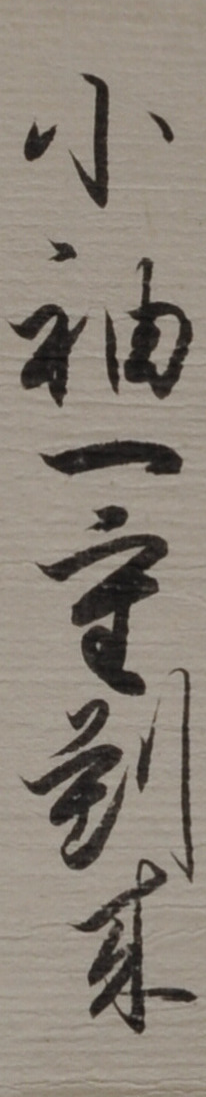小袖一重到来
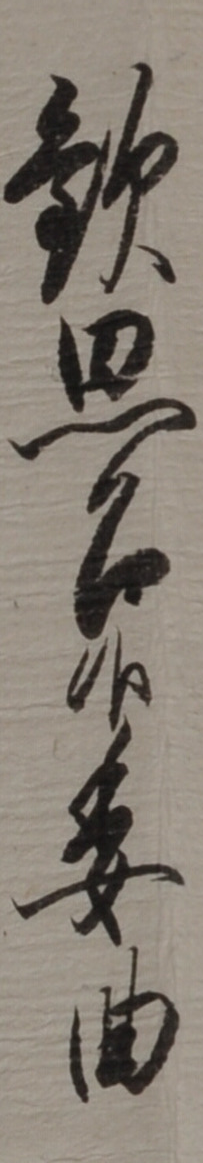歓思召候委曲
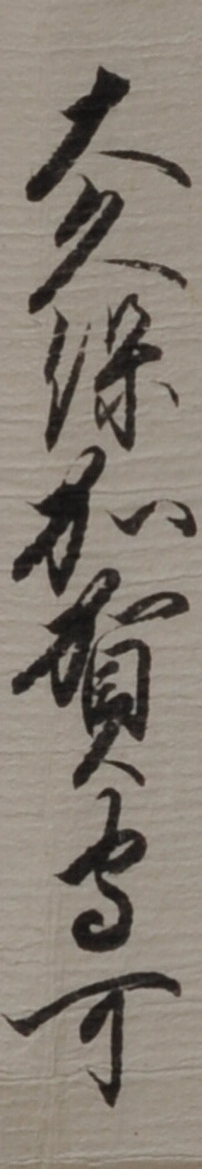大久保加賀守可
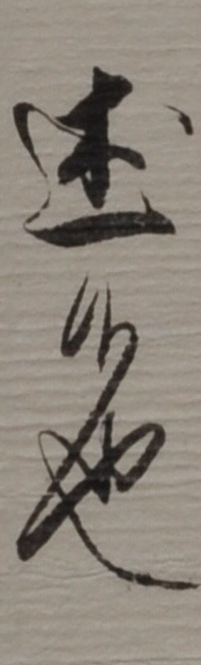述候也
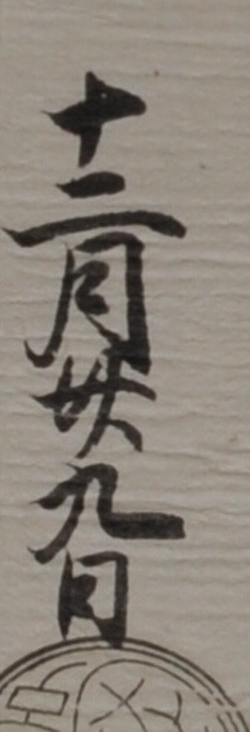十二月廿九日
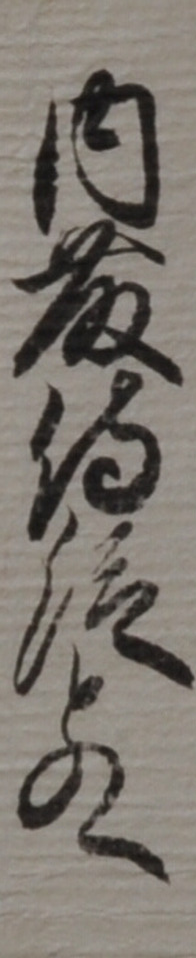内藤侍従とのへ
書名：御内書
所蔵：伊那市立高遠町図書館・合同会社AMANE
